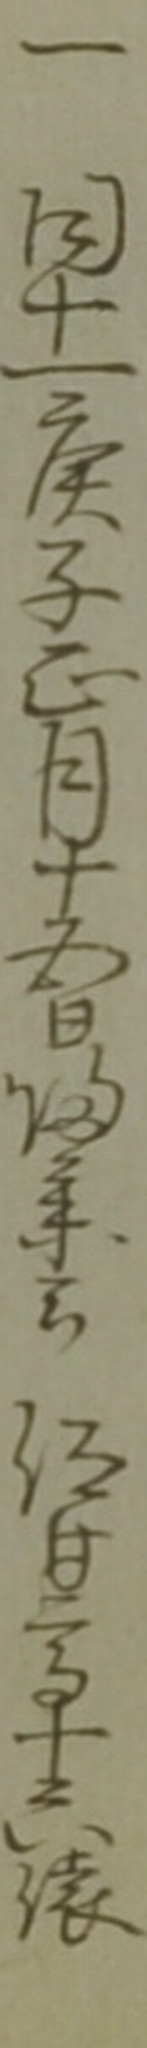一同十一庚子正月十五日帰参被仰付高十六俵
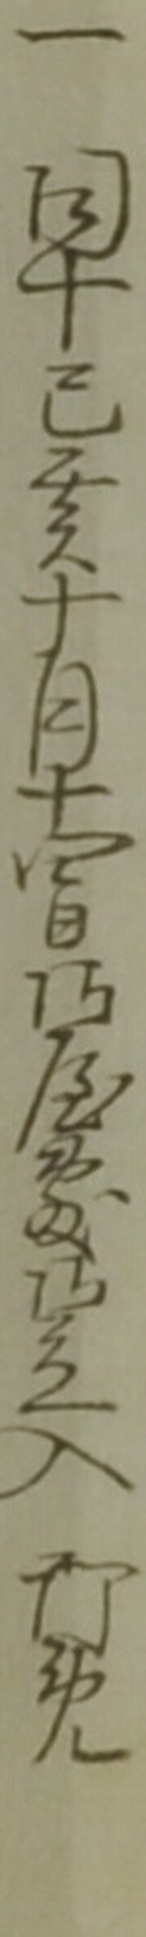一同十己亥十月十四日御屋敷御立入御免
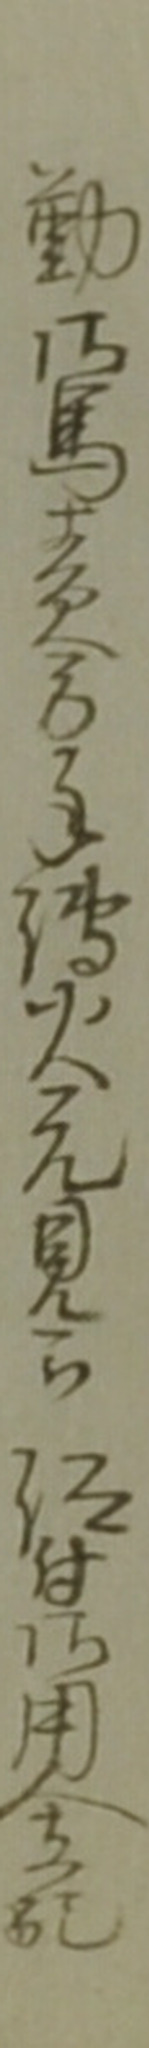勤御馬責方手伝火元見被仰付御用人支配
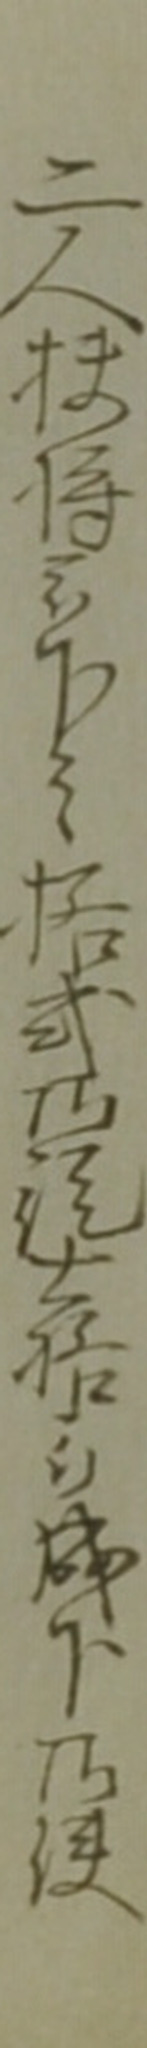二人扶持被下之格式御徒士格被成下御使
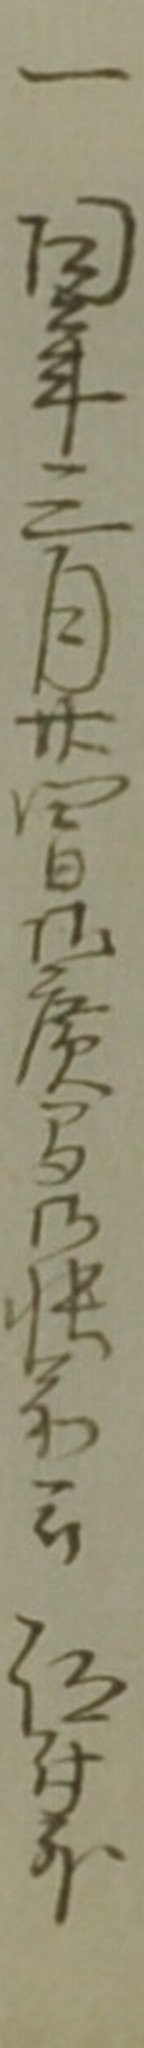一同年三月廿四日御広間御帳前被仰付外
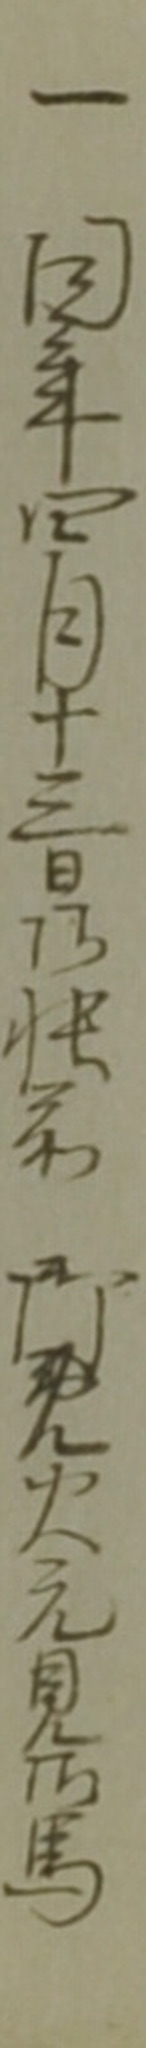一同年四月十三日御帳前御免火元見御馬
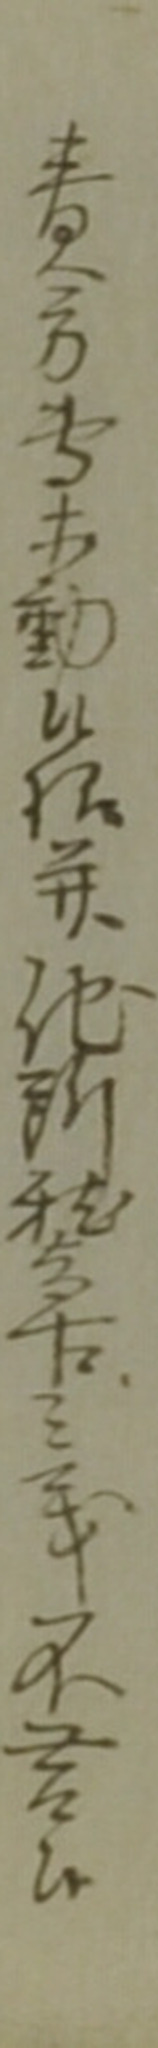責方専相勤候様并他所稽古之義不苦候
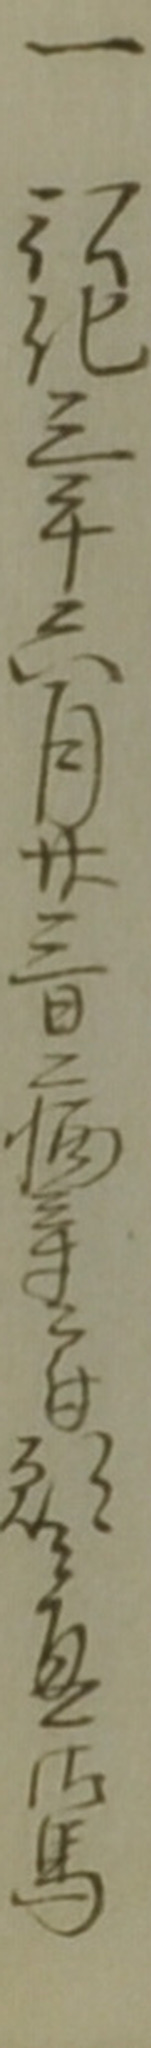一弘化三午六月廿三日病気ニ付願之通御馬
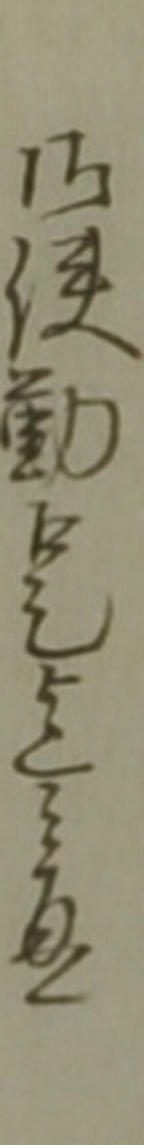御使勤是迄之通
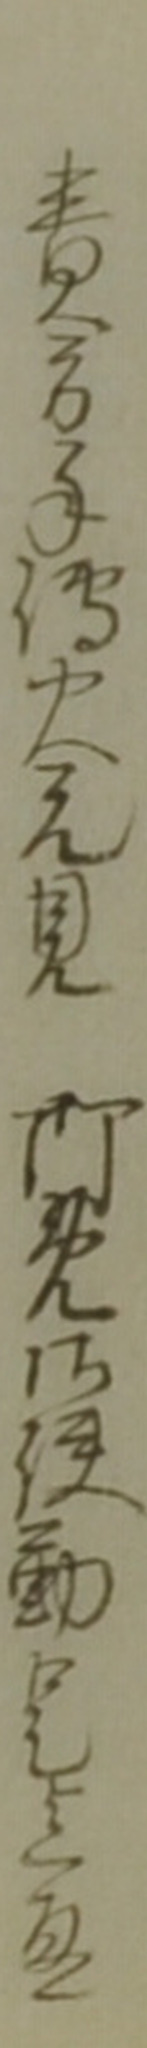責方手伝火見御免御使勤是迄之通
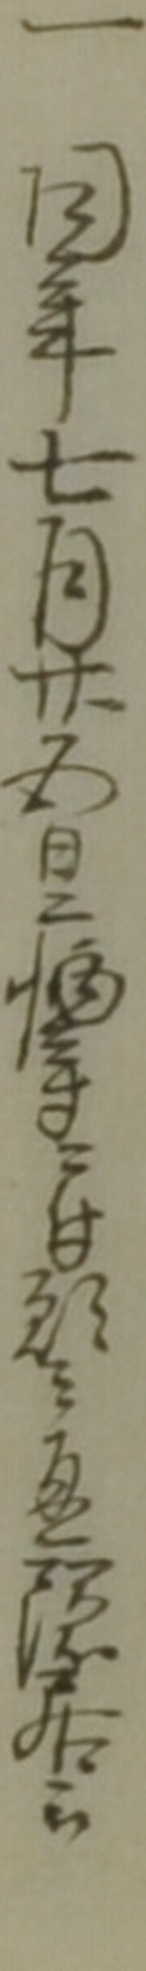一同年七月廿五日病気ニ付願之通隠居被
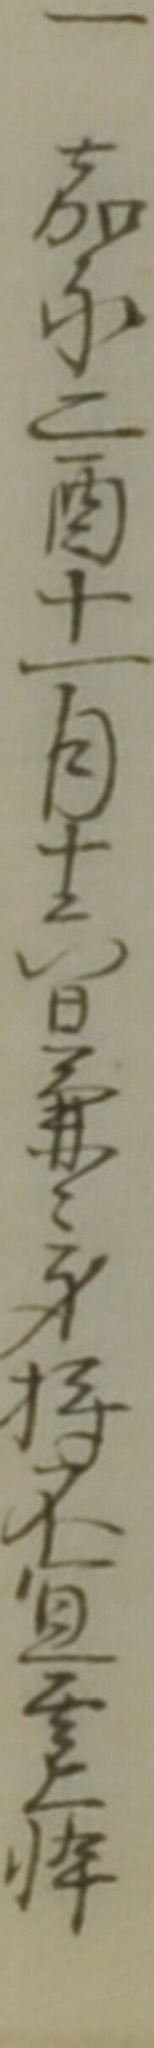一嘉永二酉十一月十六日兼々身持不宜其上忰
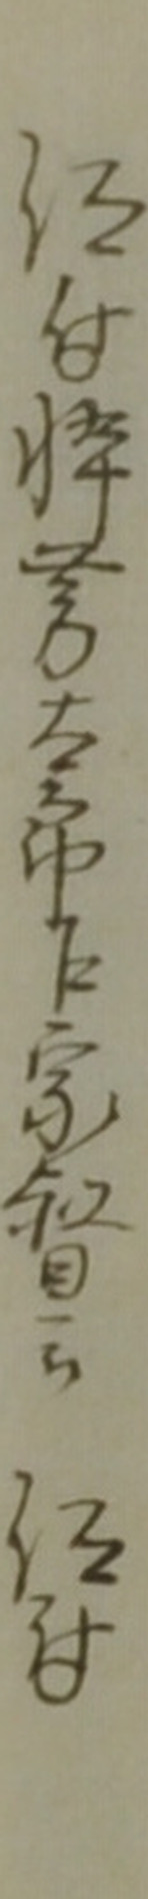仰不忰芳太郎江家督被仰付
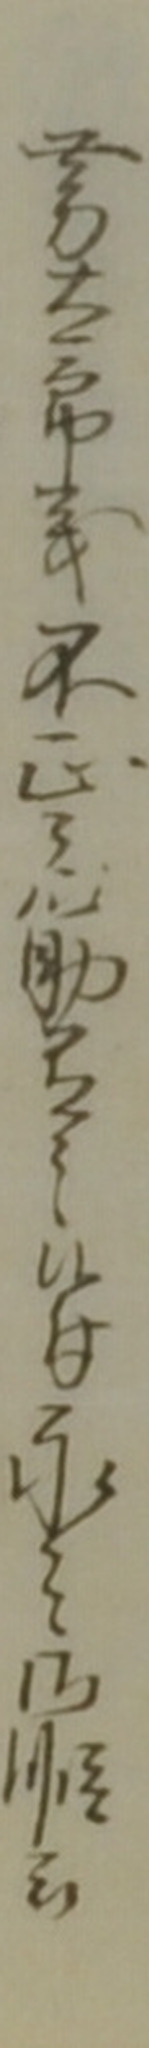芳太郎義不正之筋有之候付永之御暇被
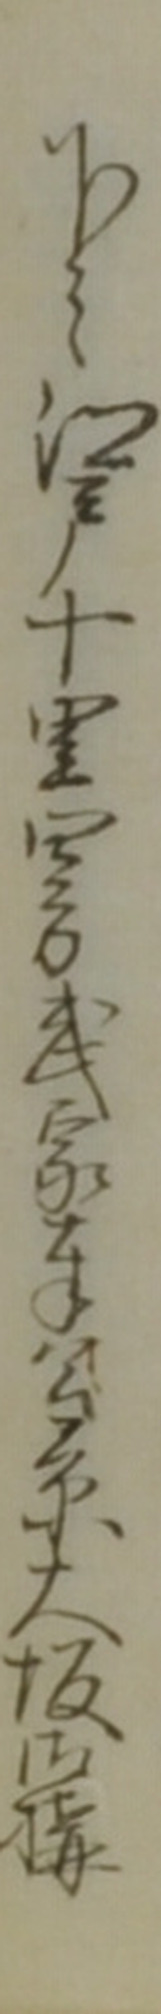下之江戸十里四方武家奉公京大坂御構
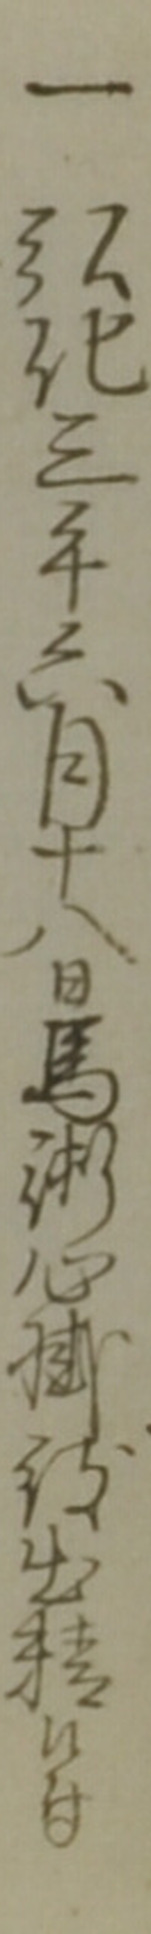一弘化三午六月十八日馬術心掛致出精候付
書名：無足廃家（弐）
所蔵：伊那市立高遠町図書館・合同会社AMANE
